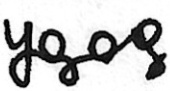удод
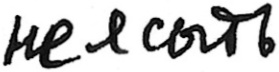неясыть
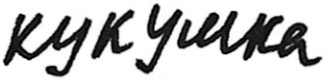кукушка
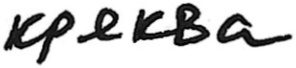кряква
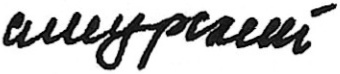амурский
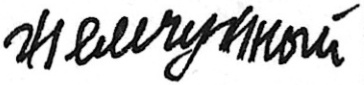жемчужный
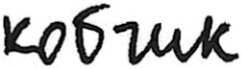кобчик
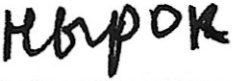нырок
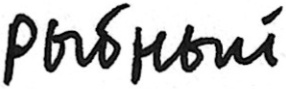рыбный
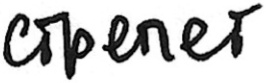стрепет
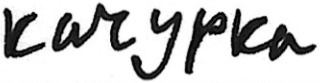качурка
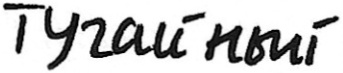тугайный
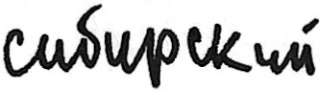сибирский
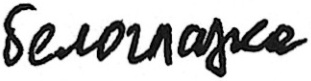белоглазка
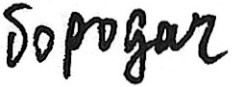бородач
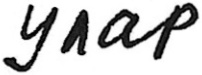улар
